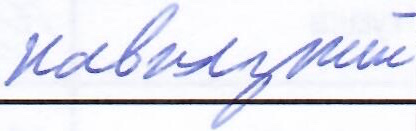кавказкий
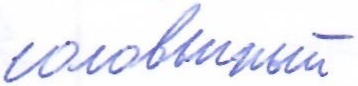соловьиный
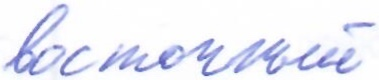восточный
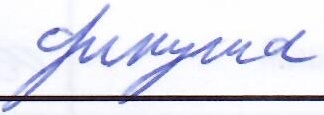дикуша
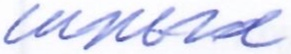синьга
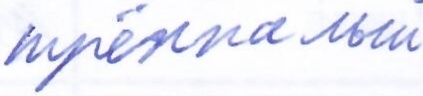трёхпалый
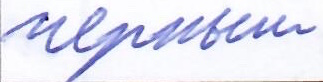черныш
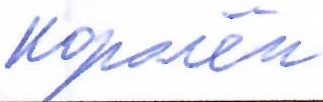королёк
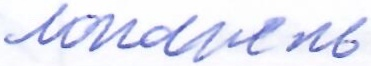лопатнь
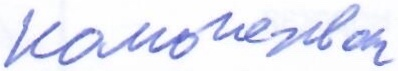колючехвот
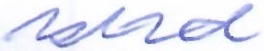гага
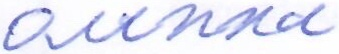оляпка
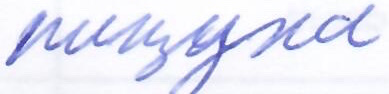пищуха
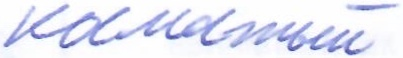каматый
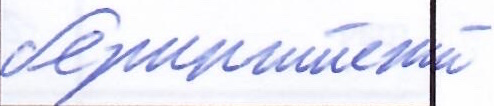берингийский
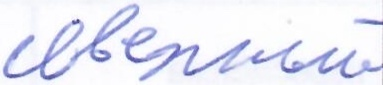северный
